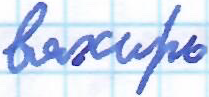вяхирь
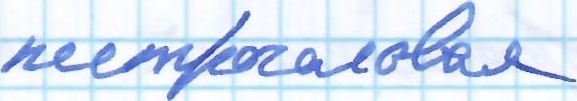пестроголовая
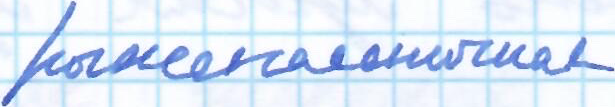рыжепоясничная
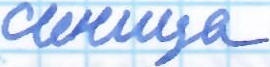синица
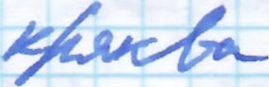кряква
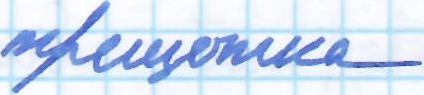трещотка
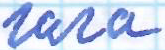гага
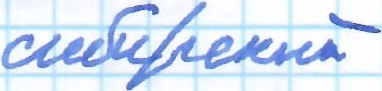сибирский
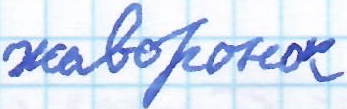жаворонок
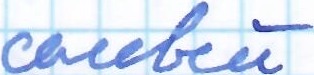соловей
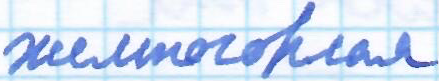желтогорлая
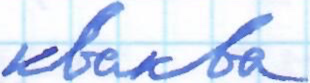кваква
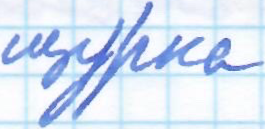щурка
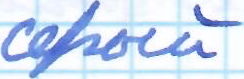серый
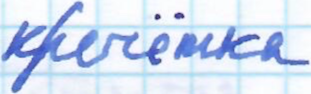кречётка
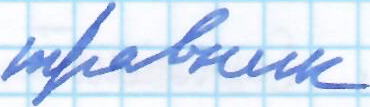травник
